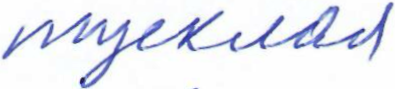тусклая
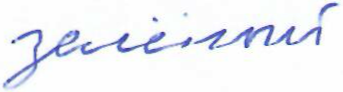зелёный
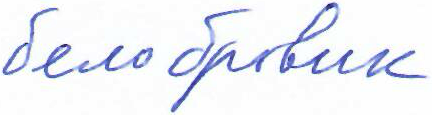бело бровик
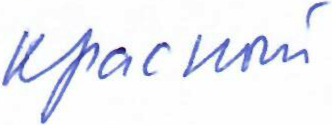красный
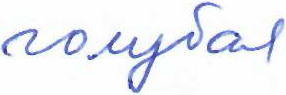голубая
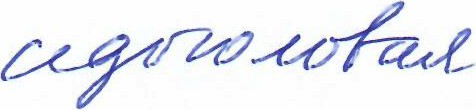седоголовая
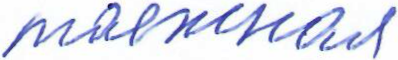таежная
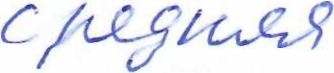средняя
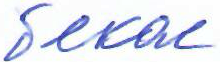бекас
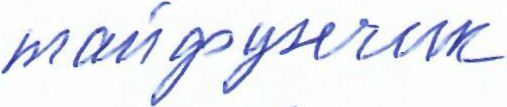тайфунчик
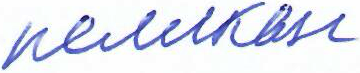пеликан
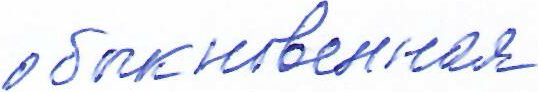обыкновенная
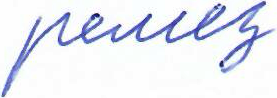ремез
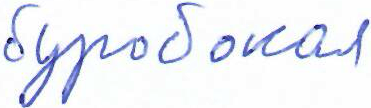буробокая
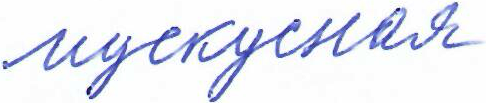мускусная
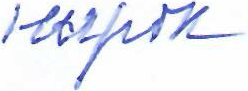нырок
